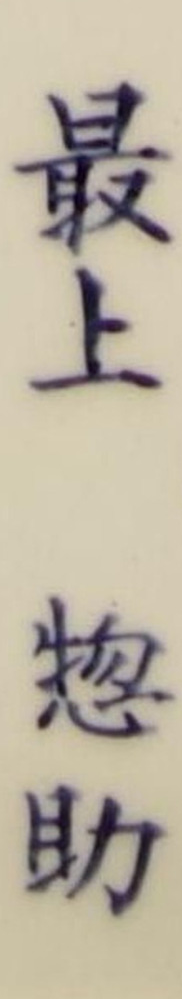最上惣助
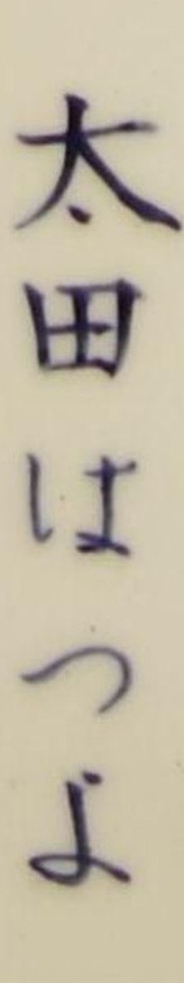太田はつよ
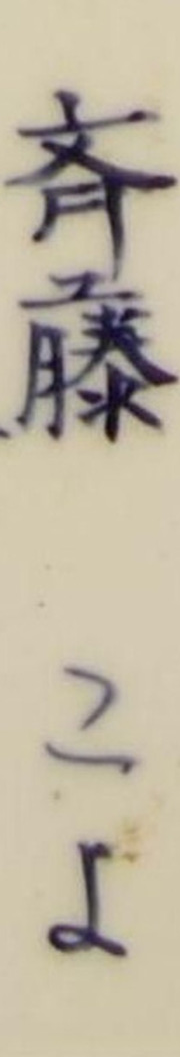斉藤こよ
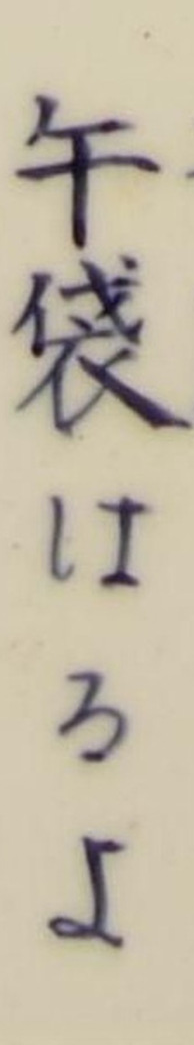午袋はるよ
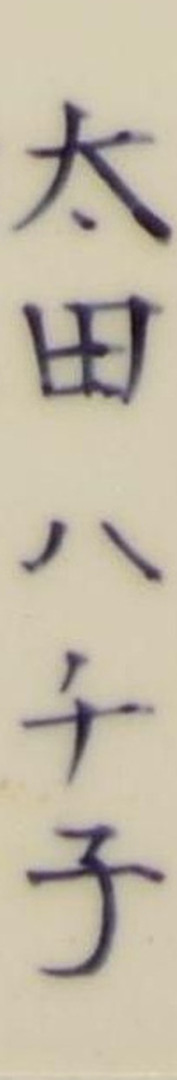太田ハチ子
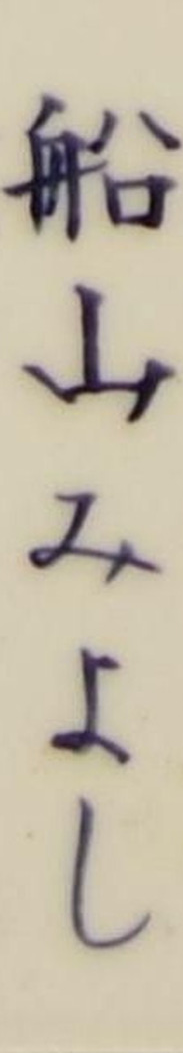船山みよし
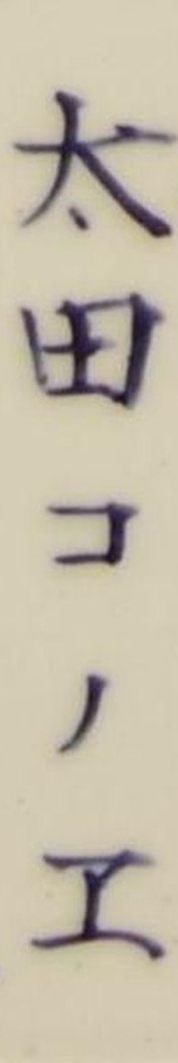太田コノエ
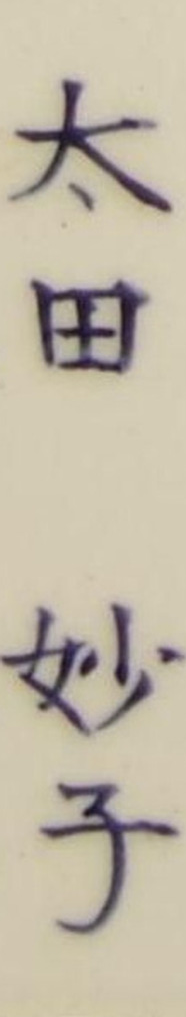太田妙子
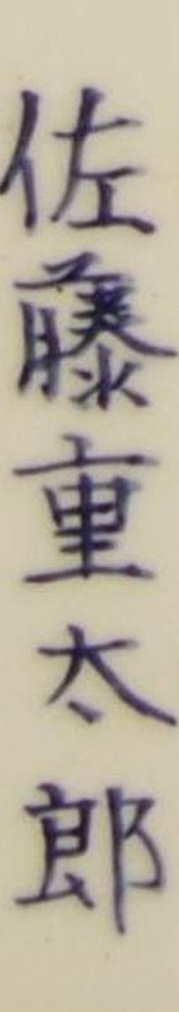佐藤重太郎
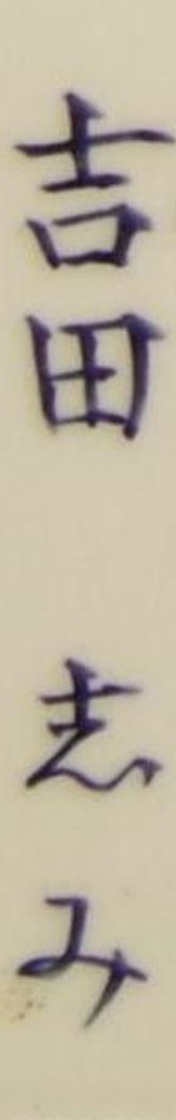吉田しみ

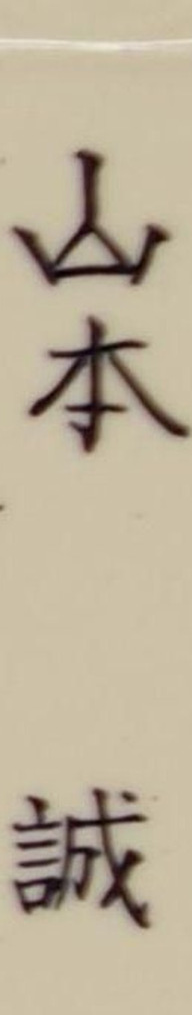山本誠
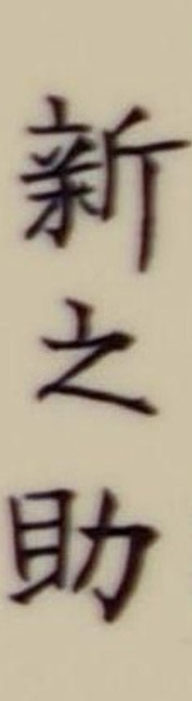新之助
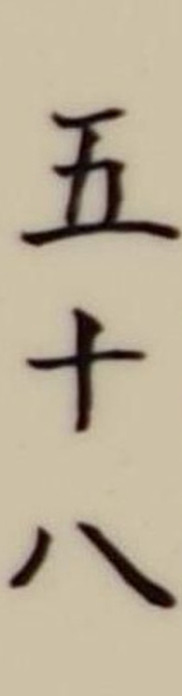五十八
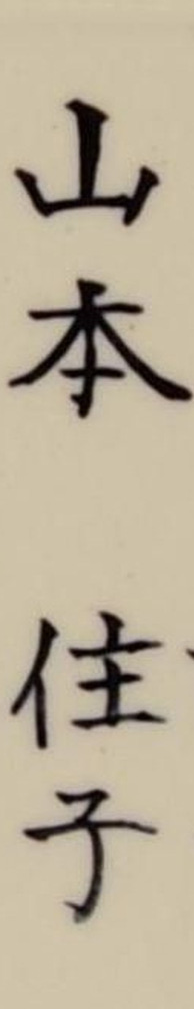山本住子
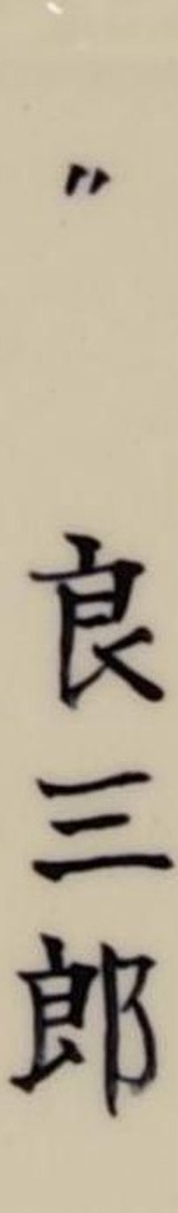良三郎
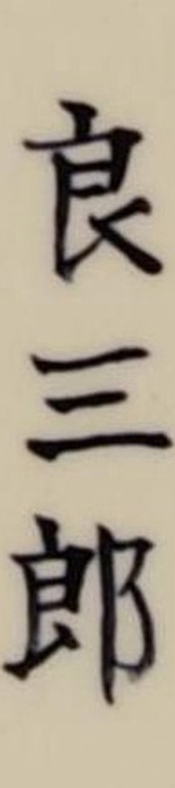良三郎
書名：A~D
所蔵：koyasan kongobuji
